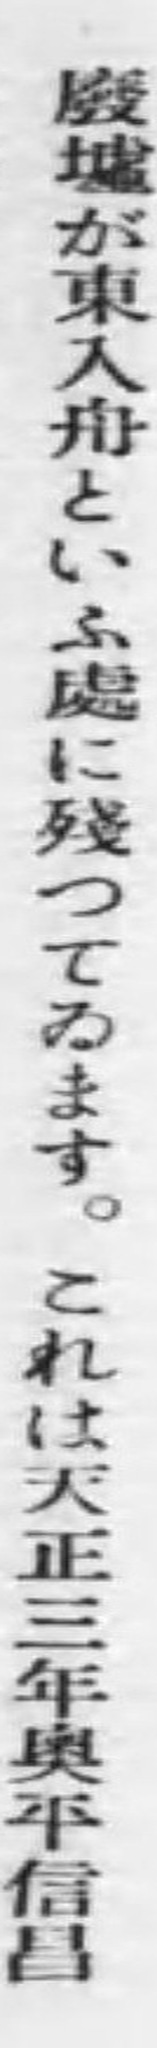廃墟が東入舟といふ処に残つてゐます。これは天正三年奥平信昌
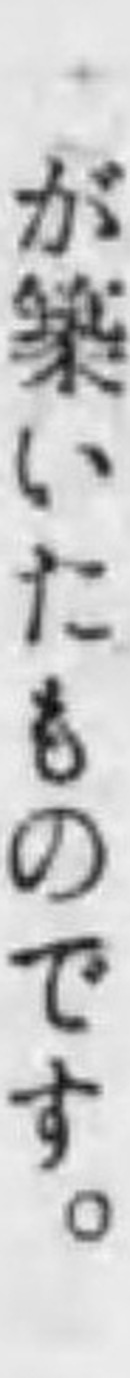が築いたものです。
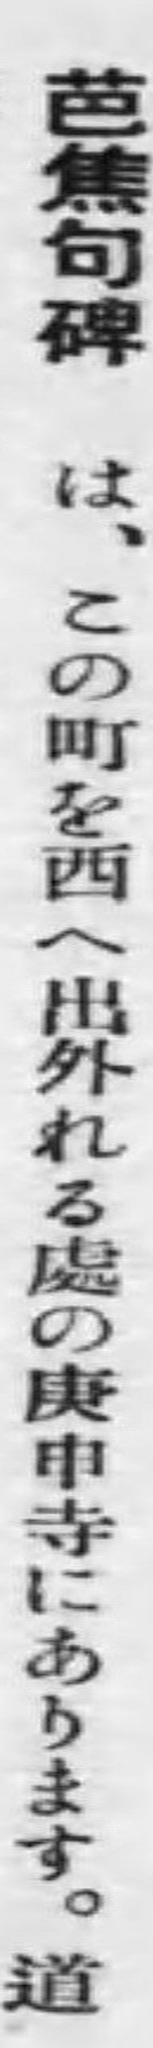芭蕉句碑は、この町を西へ出外れる処の庚申寺にあります。道
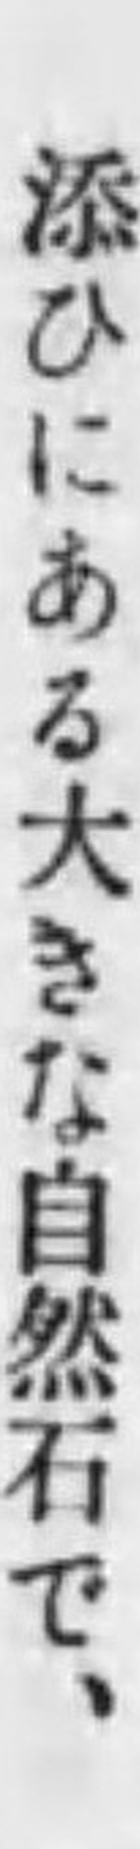添ひにある大きな自然石で、
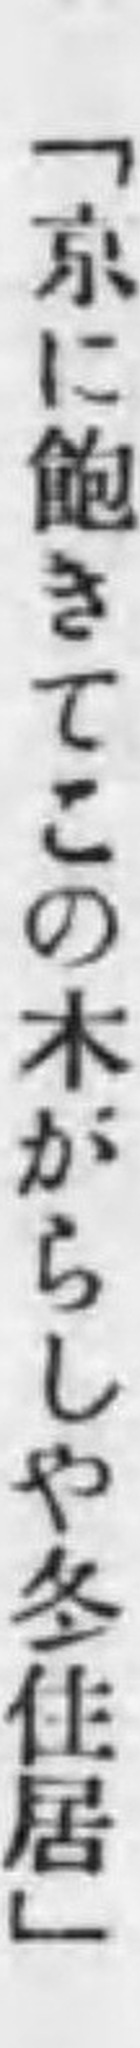「京に飽きてこの木がらしや冬住居」
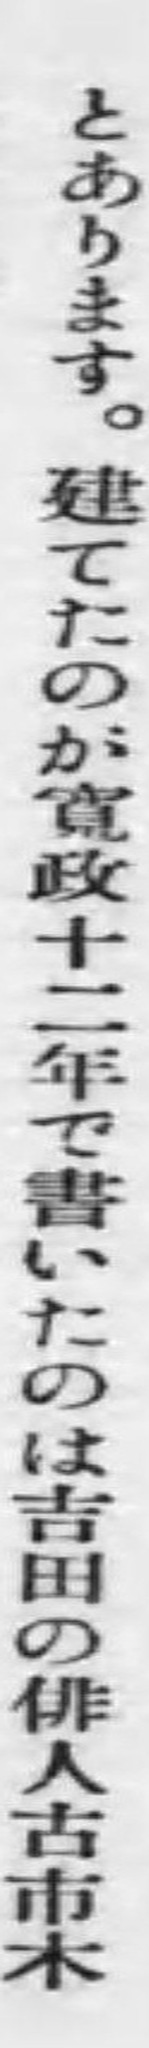とあります。建てたのが寛政十二年で書いたのは吉田の俳人古市木
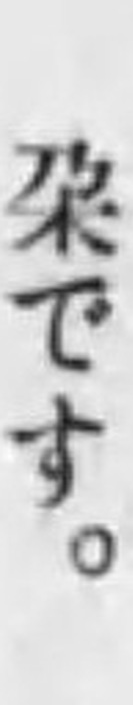朶です。
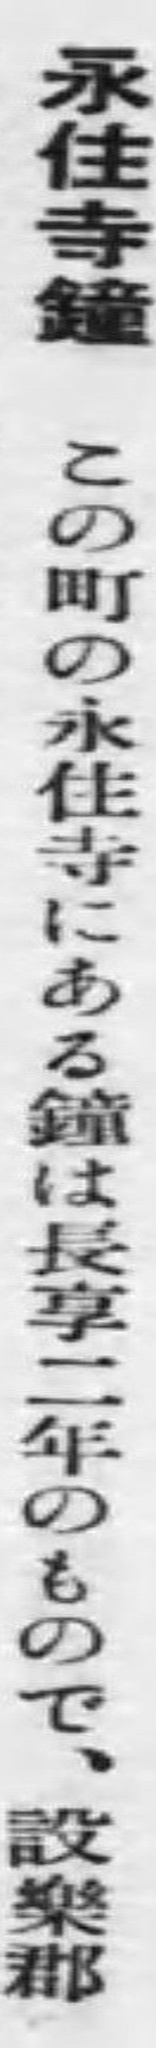永住寺鐘この町の永住寺にある鐘は長享二年のもので、設楽郡
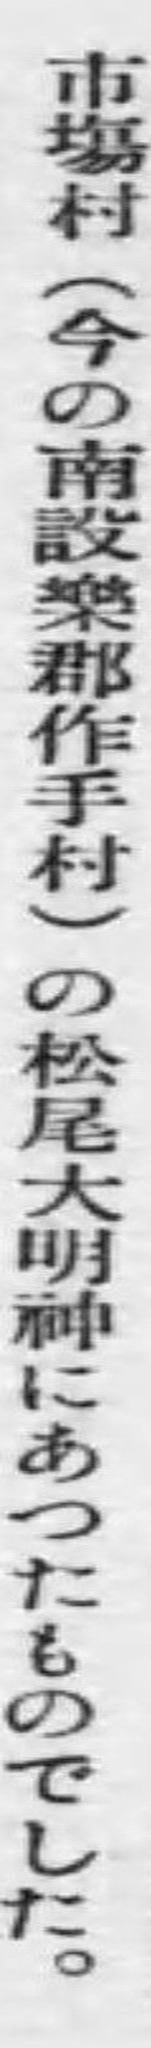市場村(今の南設楽郡作手村)の松尾大明神にあつたものでした。
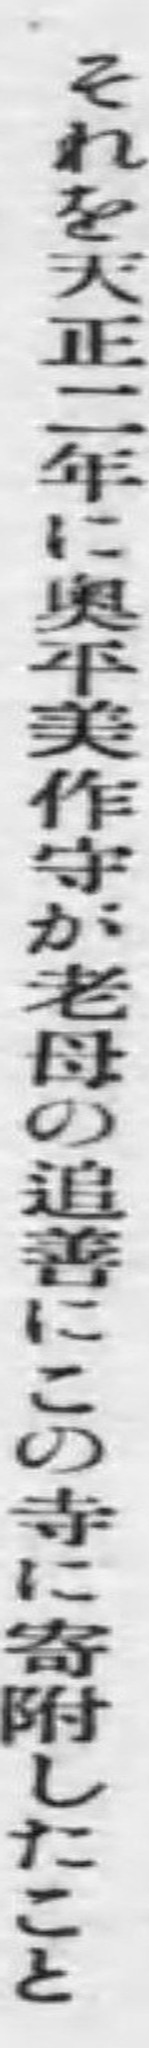それを天正二年に奥平美作守が老母の追善にこの寺に寄附したこと
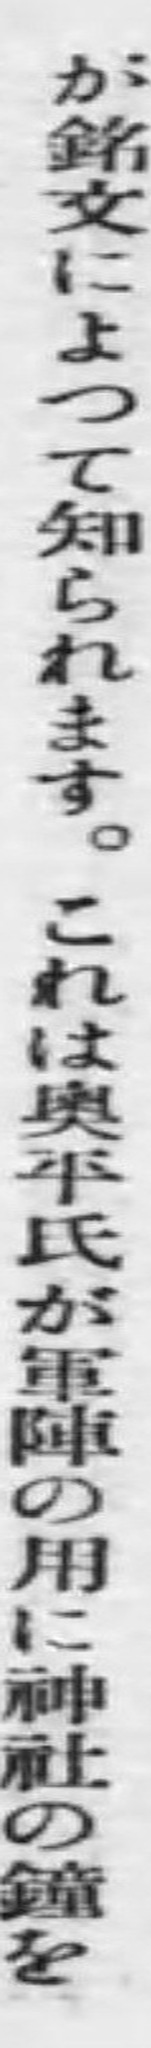が銘文によつて知られます。これは奥平氏が軍陣の用に神社の鐘を
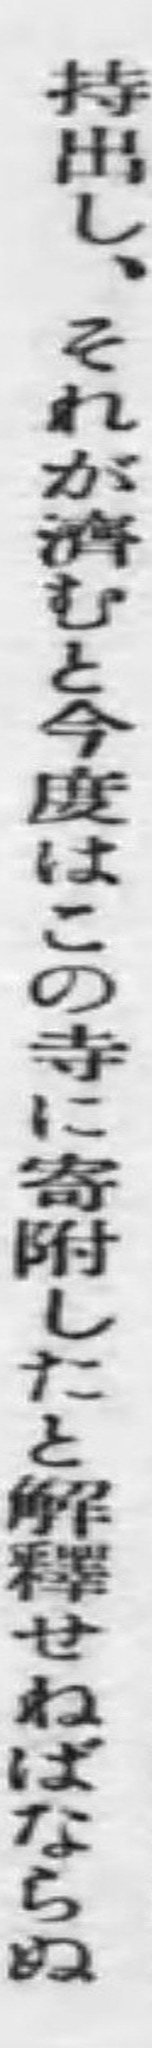持出し、それが済むと今度はこの寺に寄附したと解釈せねばならぬ
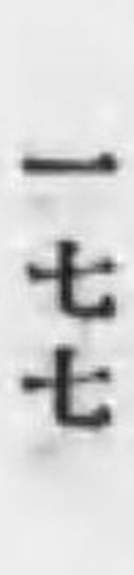一七七

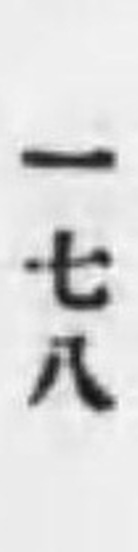一七八
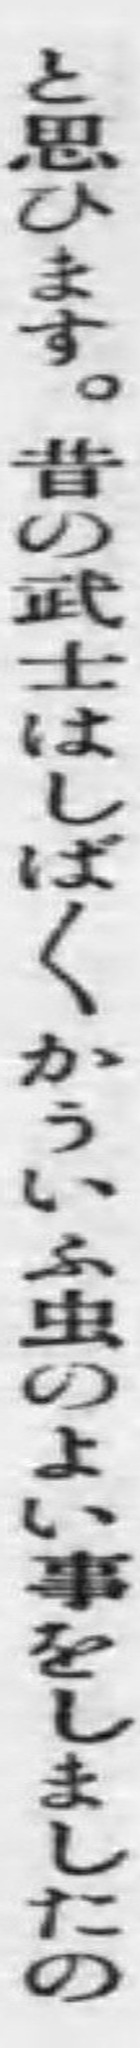と思ひます。昔の武士はしば〳〵かういふ虫のよい事をしましたの
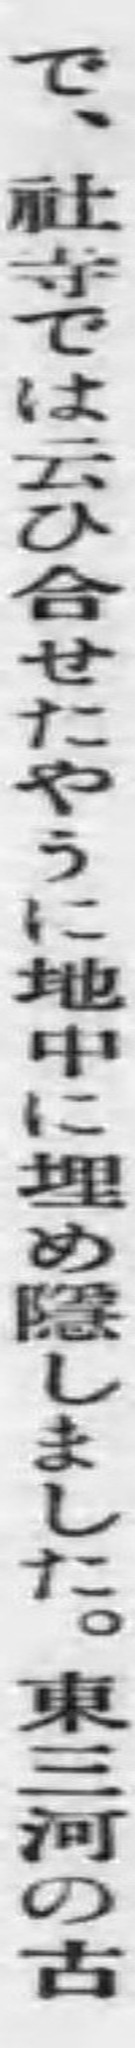で、社寺では云ひ合せたやうに地中に埋め隠しました。東三河の古
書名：東三河道中記 : 豊橋市及其附近案内
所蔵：国立国会図書館 National Diet Library, JAPAN
